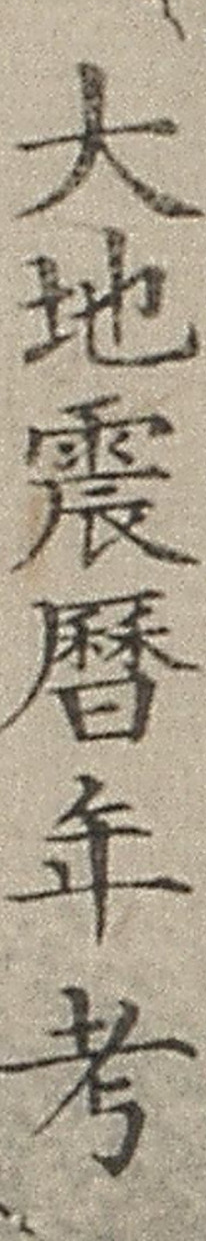大地震曆年考全

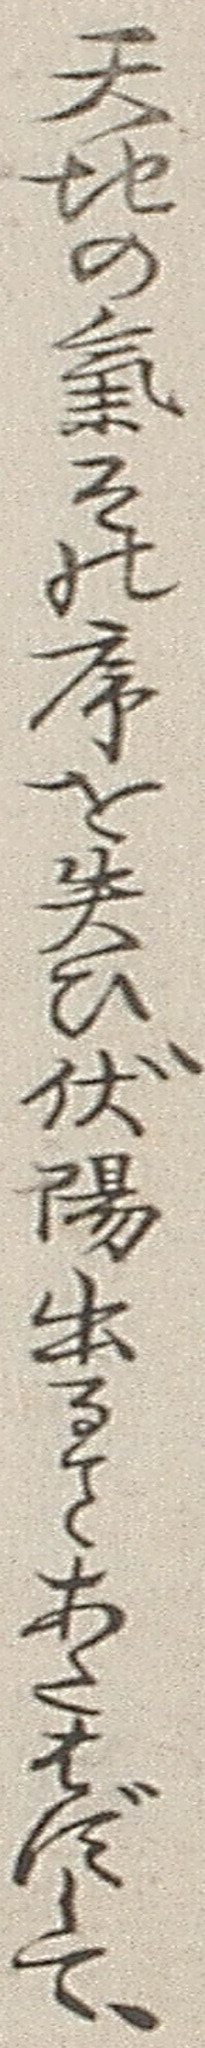天地の気その序を失ひ、伏陽出ることあたはずして、
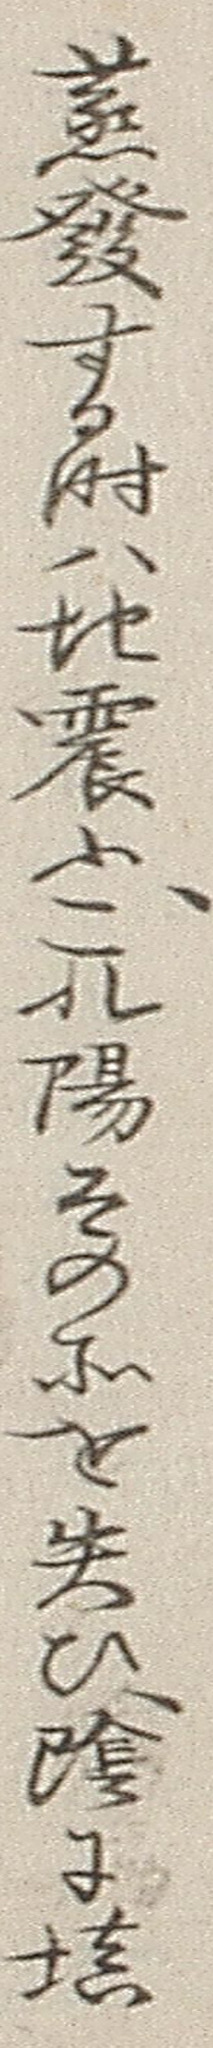蒸発する時ハ地震に、これ陽その所を失ひ陰に填
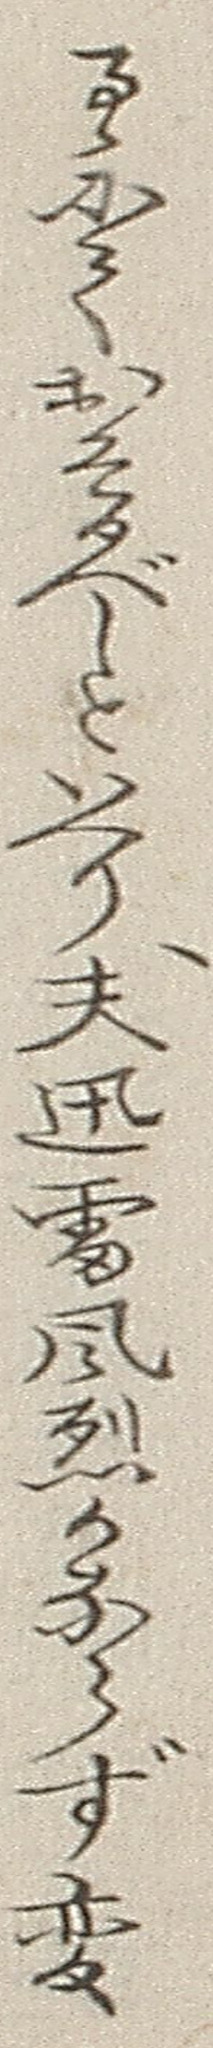るゝにておそるべしといへり、夫迅雷風烈かならず変
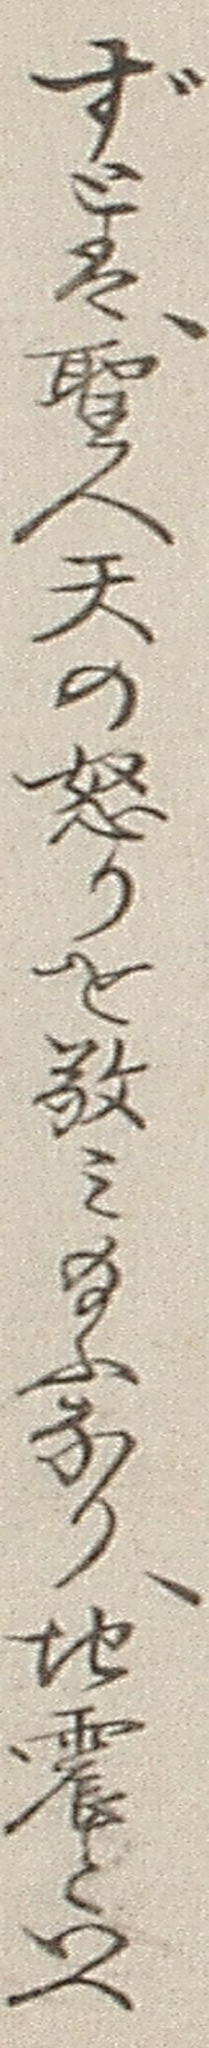ずとは、聖人天の怒りを敬ミ給ふなり、地震といへ
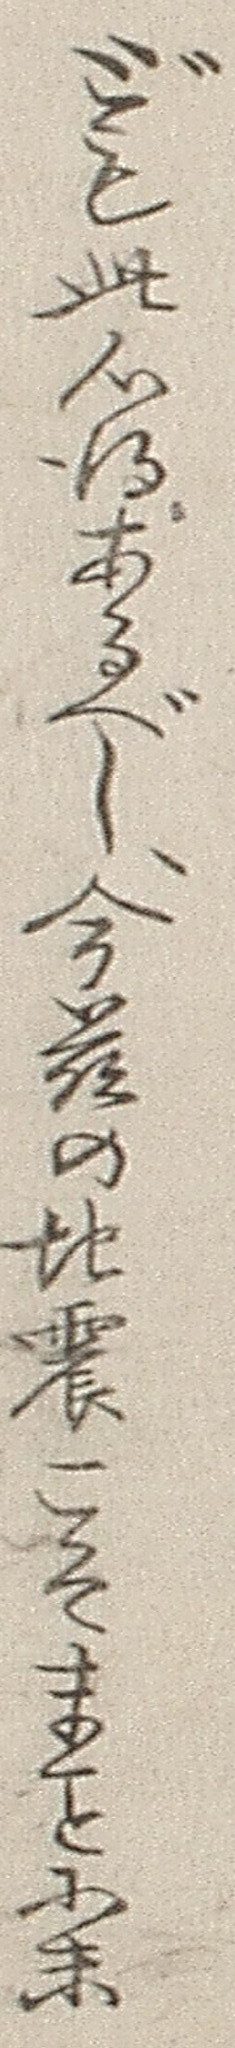ども此心得あるべし、今茲の地震こそまことに未

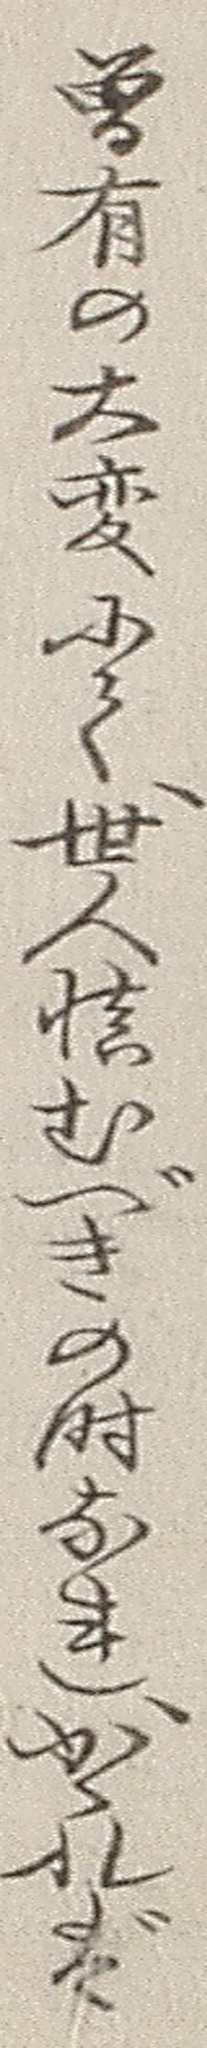曾有の大変にて、世人慎むべきの時なれ、かゝれば
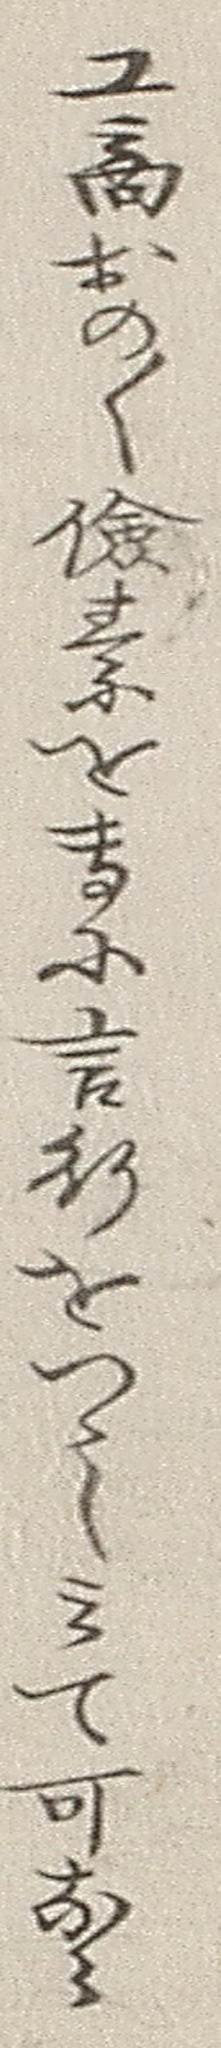工商おの〳〵倹素を専に言行をつゝしみて可なら
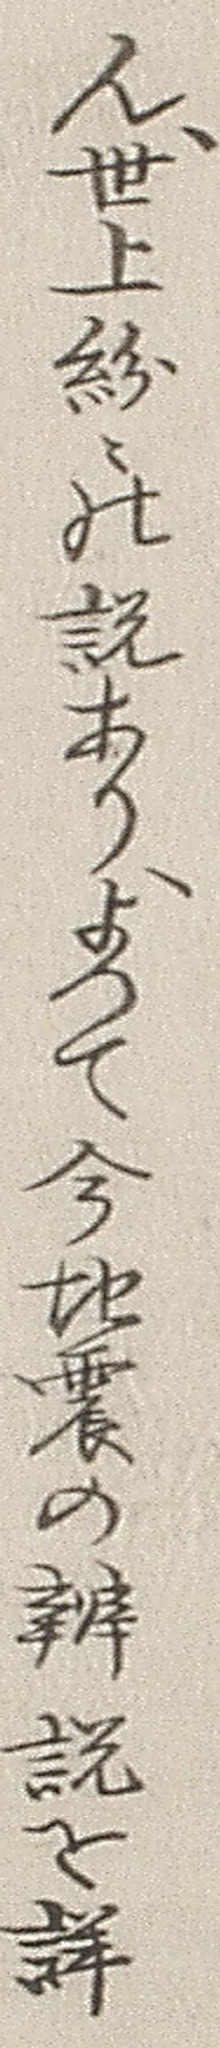ん、世上紛々の説あり、よつて今地震の弁説を詳
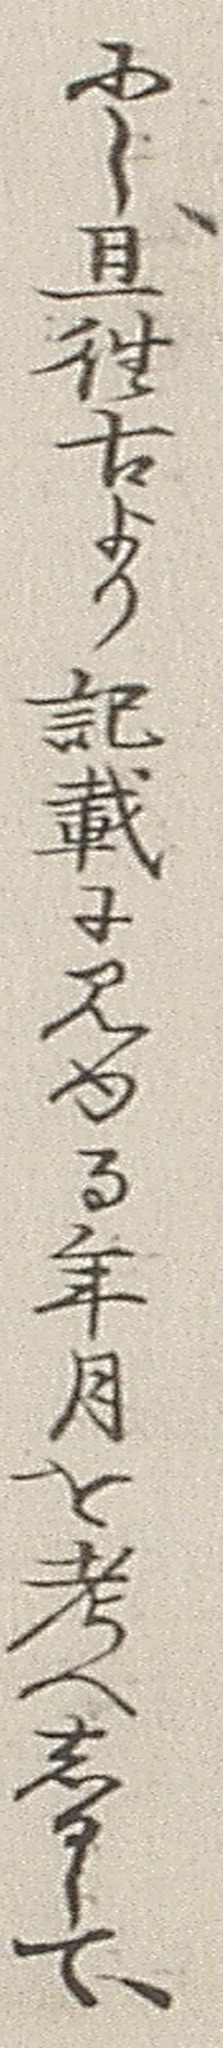にし、且往古より記載に見ゆる年月を考へしるして、
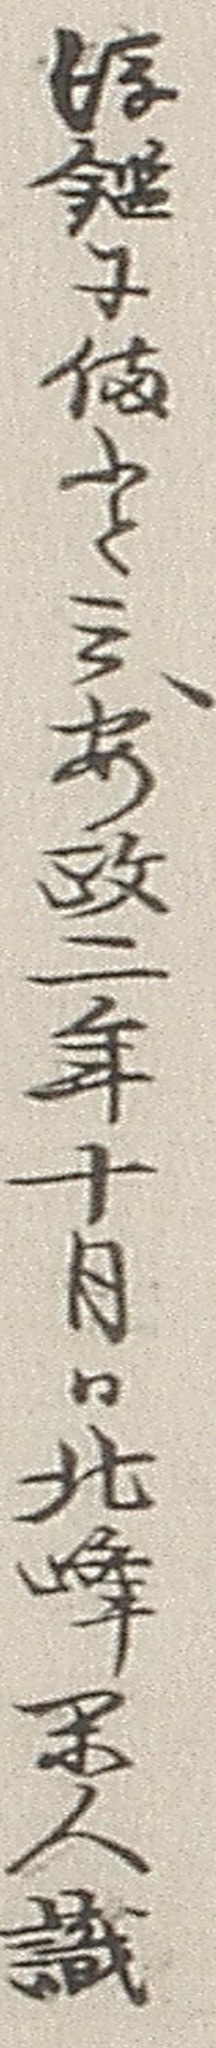後鑑に備ふと言、安政二年十月日北峰閑人識
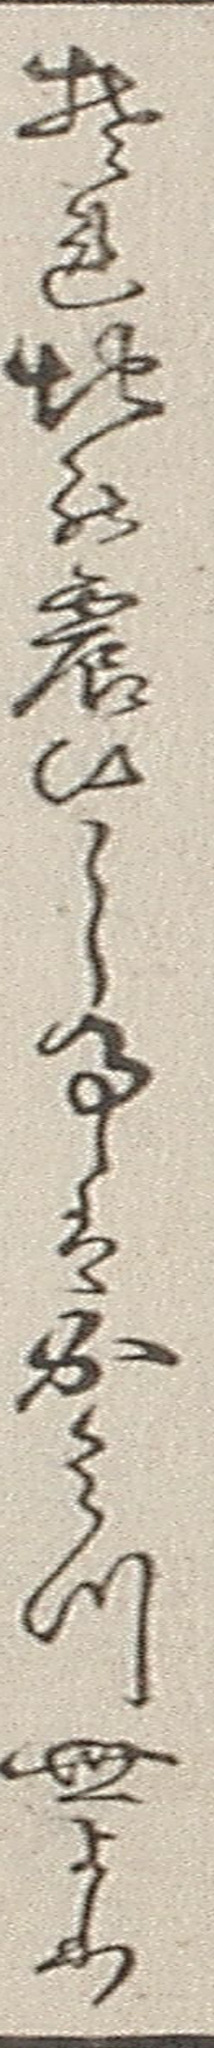それ地の震ひし事はかみつ世より
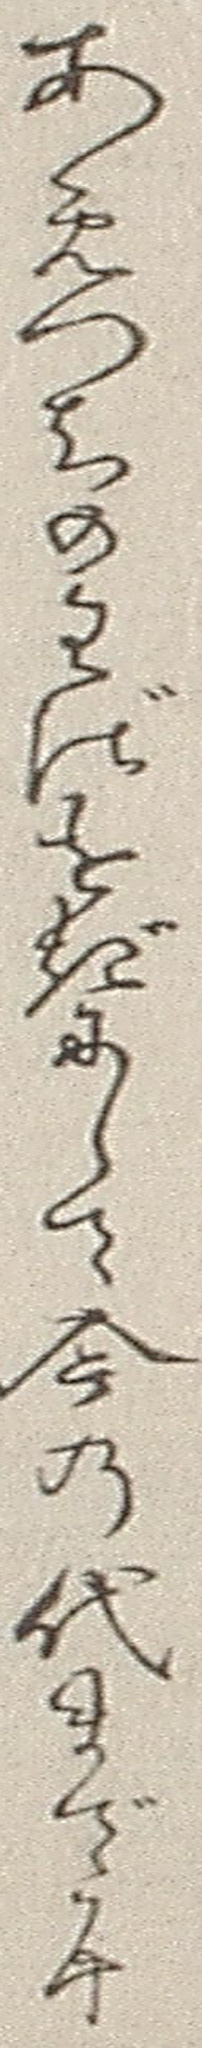あめつちのわざをぎにして今の代までた年
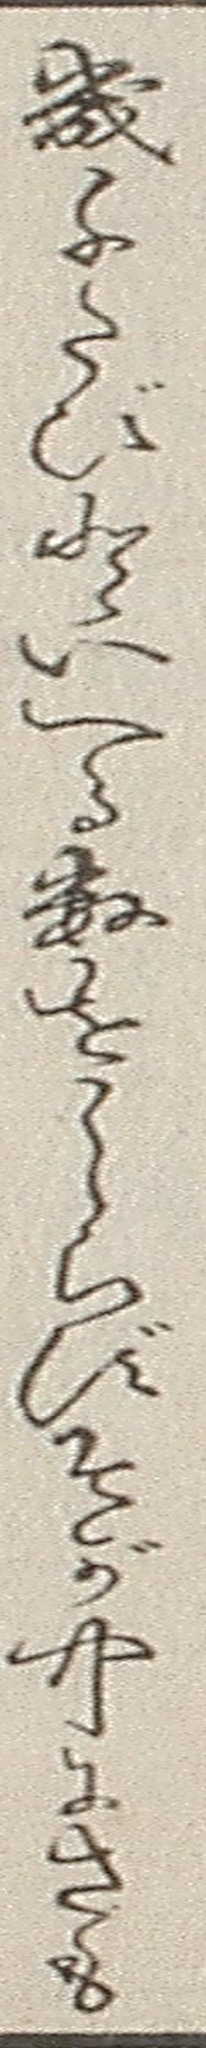幾千たびといへる数をしらずそが中にさも
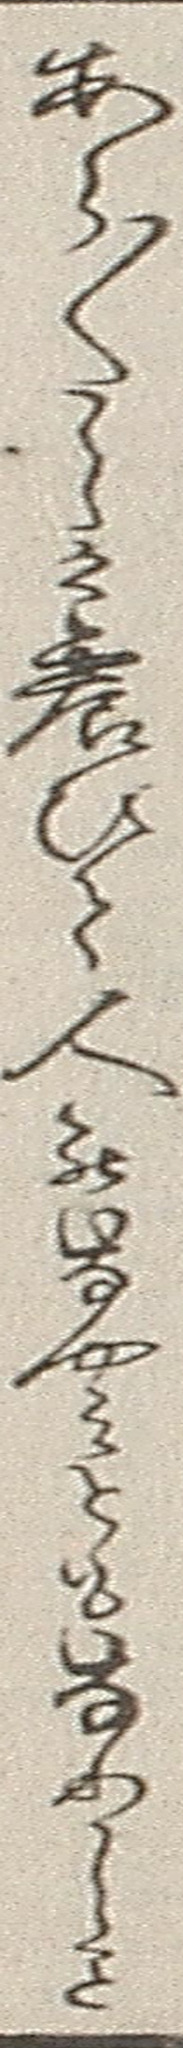あら〳〵しく震ひて人のなやみともなりしこと
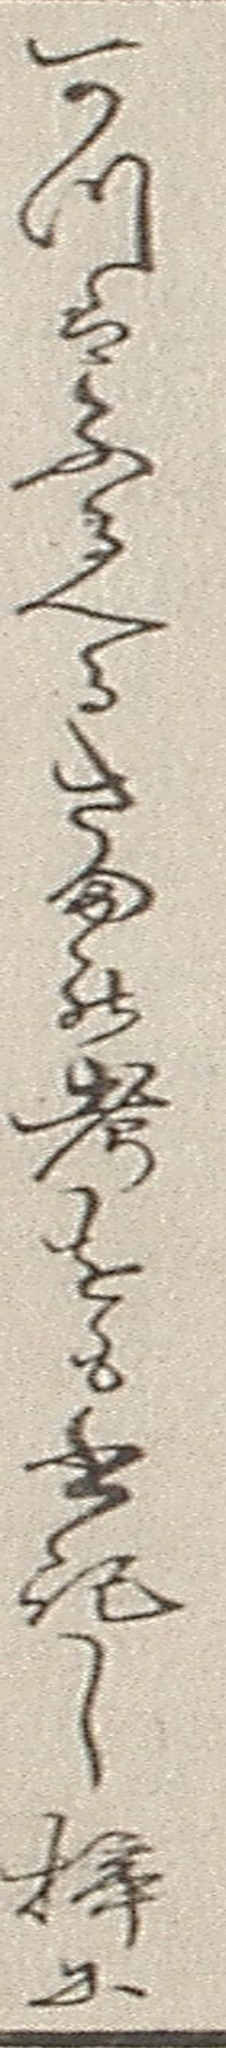かつはふるへるさまの考をも書記し梓に
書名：大地震暦年考　全
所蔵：東京大学地震研究所図書室 Earthquake Research Institute Library, The University of Tokyo, JAPAN
